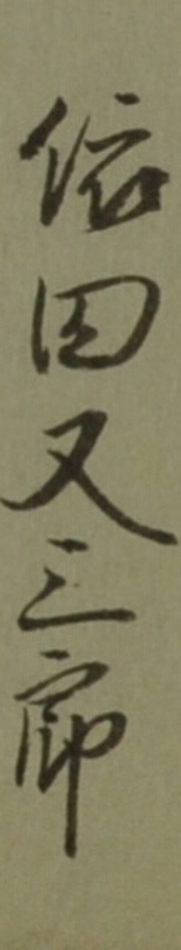依田又三郎
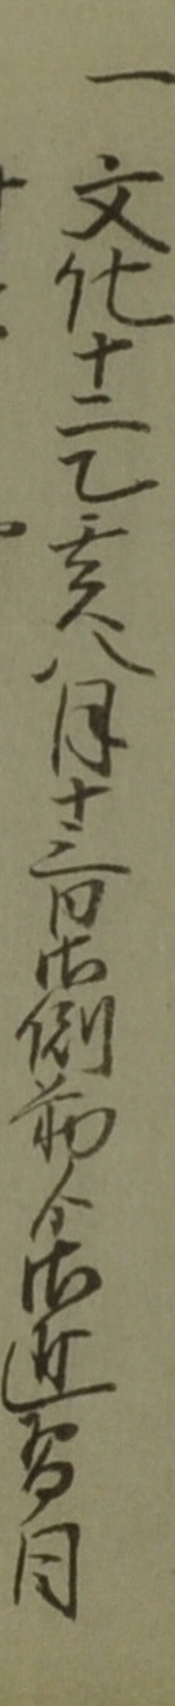一文化十二乙亥八月十三日御側勤ゟ御近習目
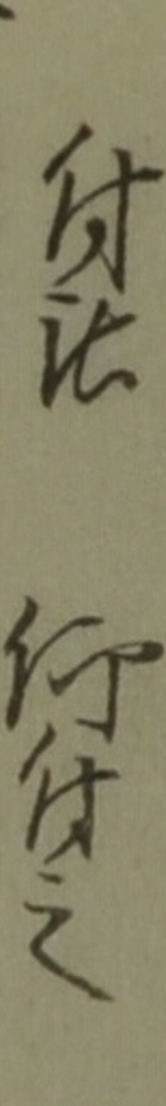付被仰付之
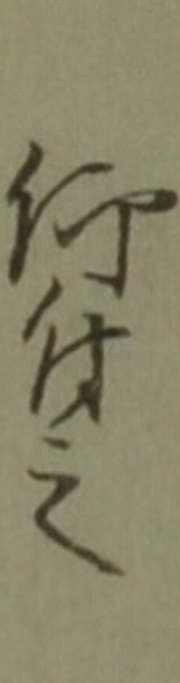仰付之
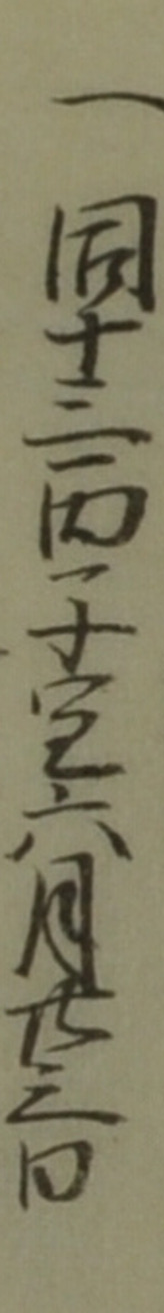一同十三丙子閏六月廿三日
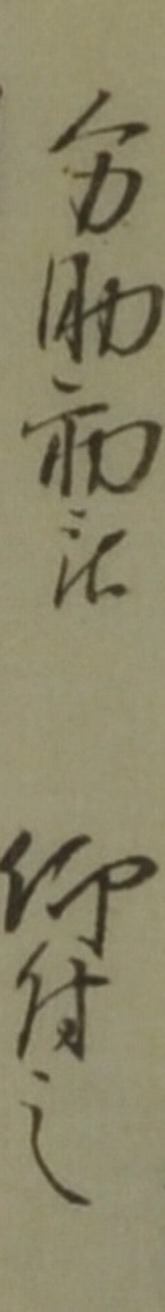分助勤被仰付之
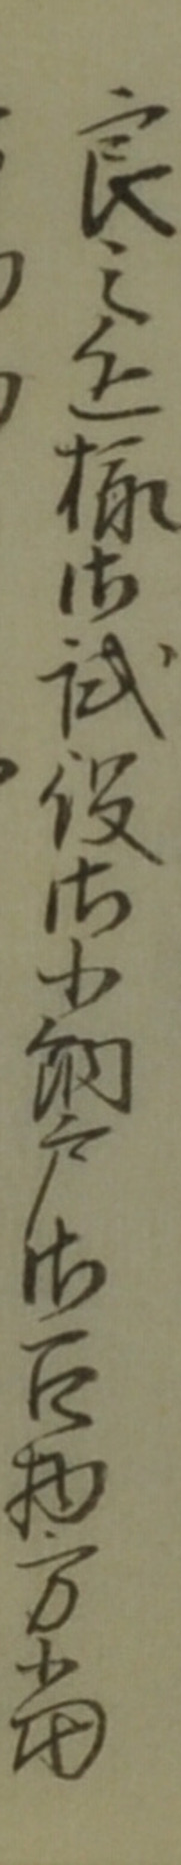良之進様御試役御小納戸御召物方当
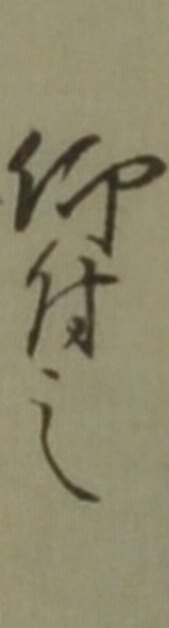仰付之
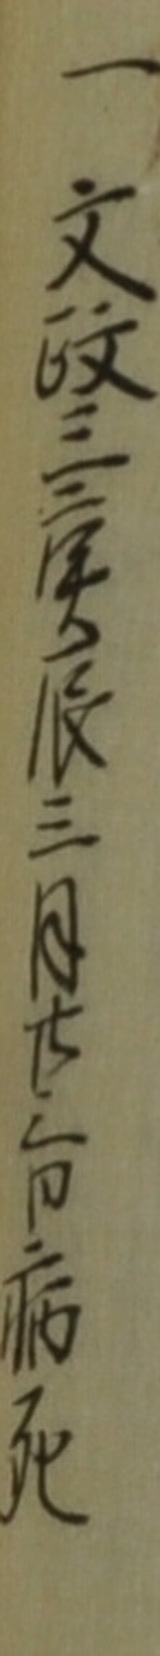一文政三庚辰三月廿三日病死
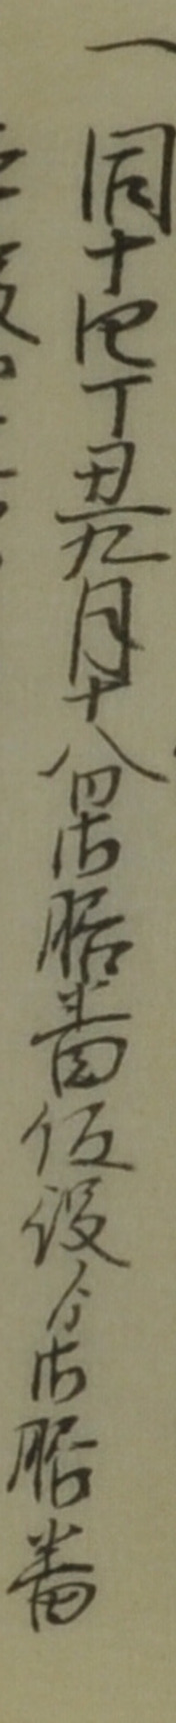一同十四丁丑九月十八日御膳番仮役ゟ御膳番
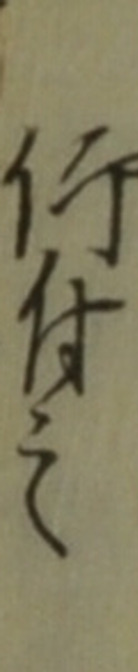仰付之
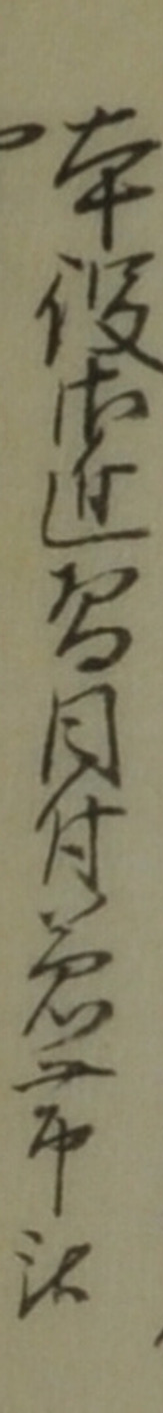本役御近習目付兼帯被
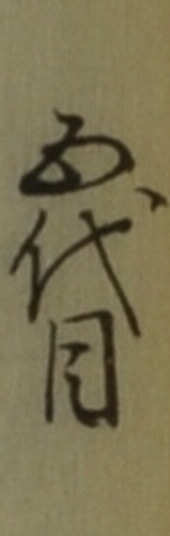五代目
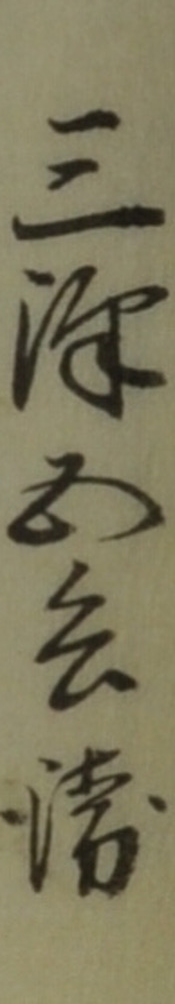三沢五兵衛
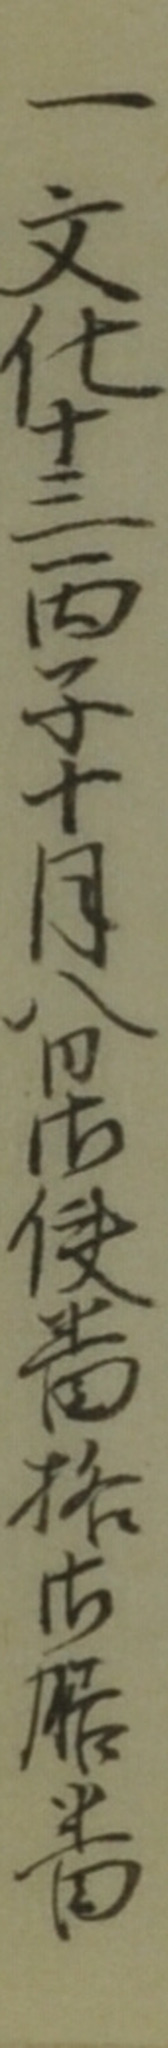一文化十三丙子十月八日御使番格御膳番
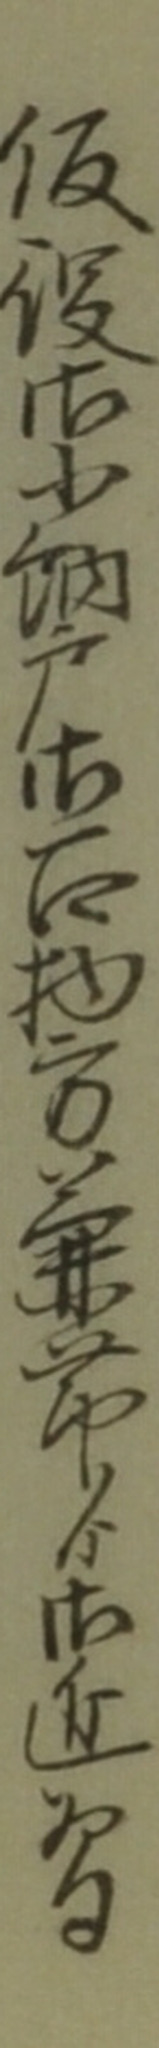仮役御小納戸御召物方兼帯ゟ御近習
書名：諸御役代々録（四）
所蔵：伊那市立高遠町図書館・合同会社AMANE
